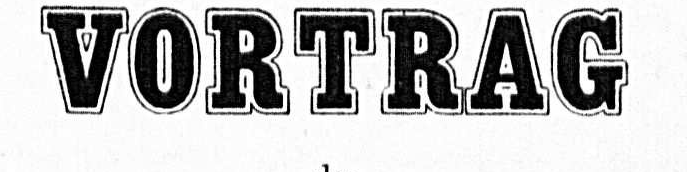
VORTRAG
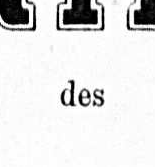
des
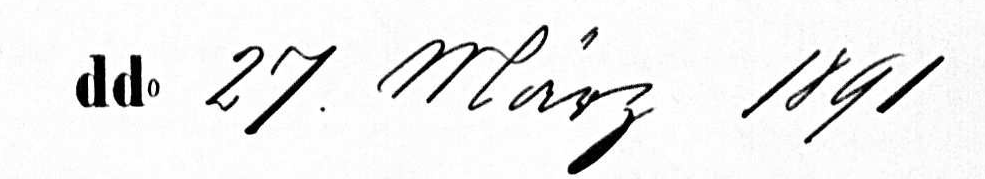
Ddo 27. März 1891
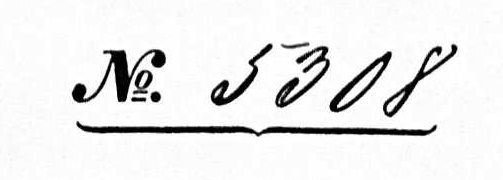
No. 5308
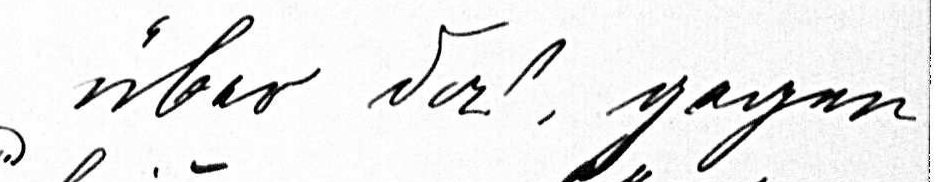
über das gegen
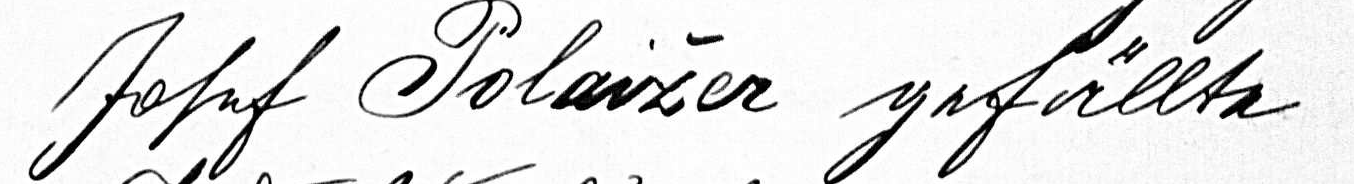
Josef Polaižer gefällte
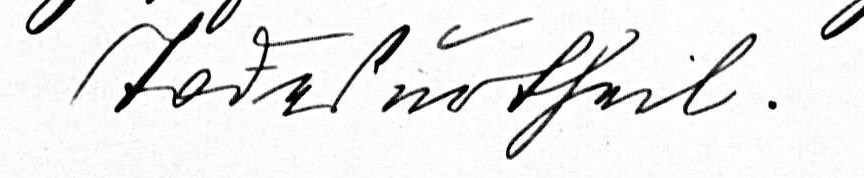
Todesurtheil.
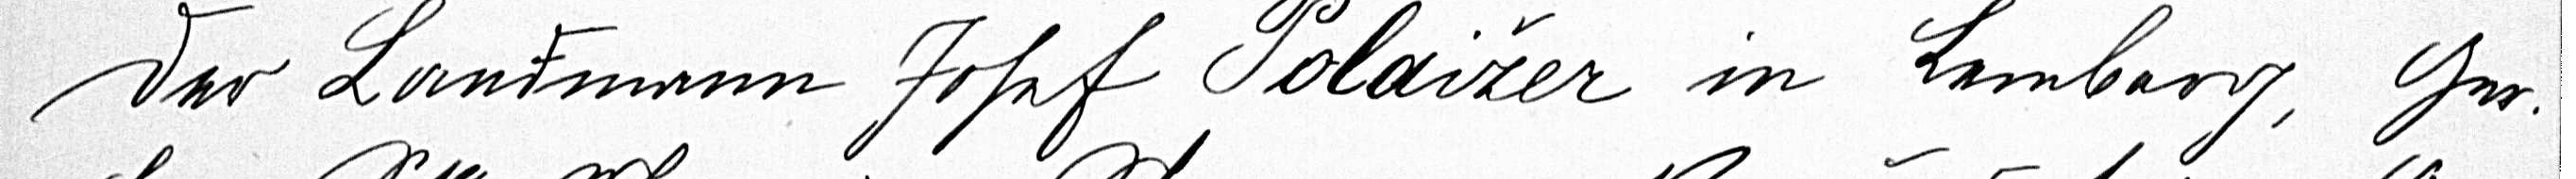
Der Landmann Josef Polaižer in Lemberg, Ger.
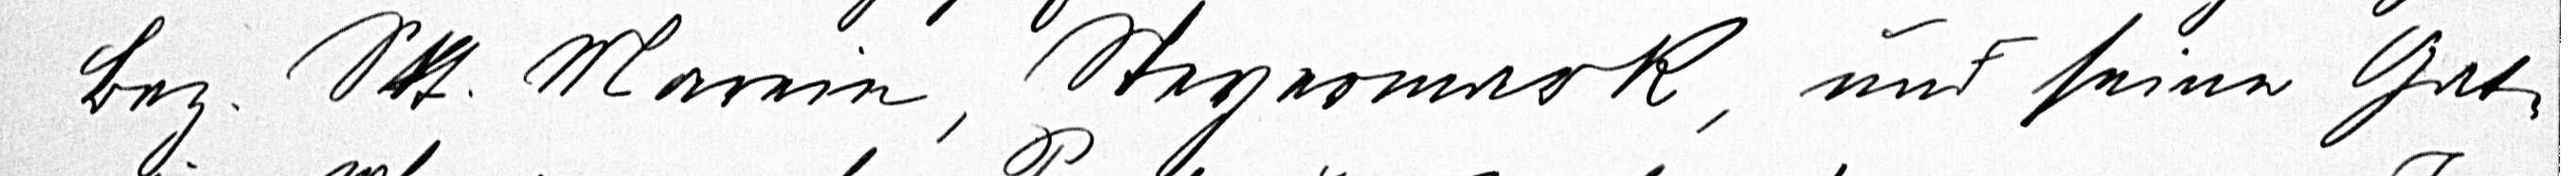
Bez. Skt Marein, Steyermark, und seine Gat¬
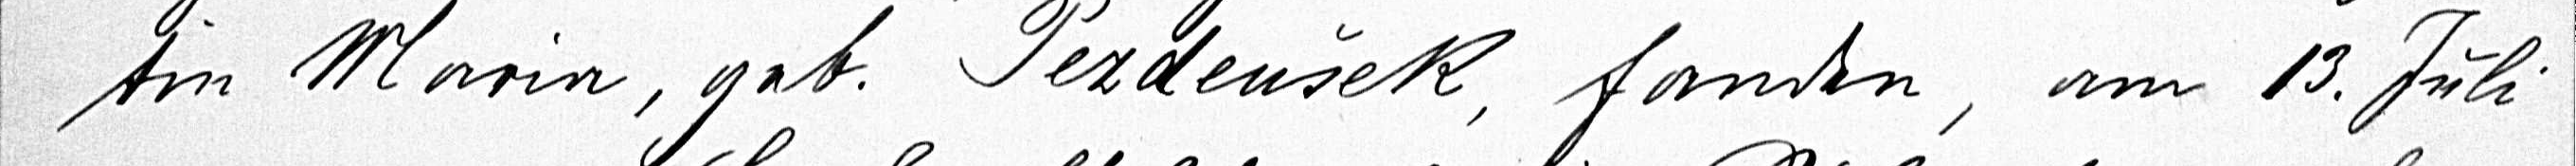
tin Maria, geb. Pezdeušek, fanden, am 13. Juli
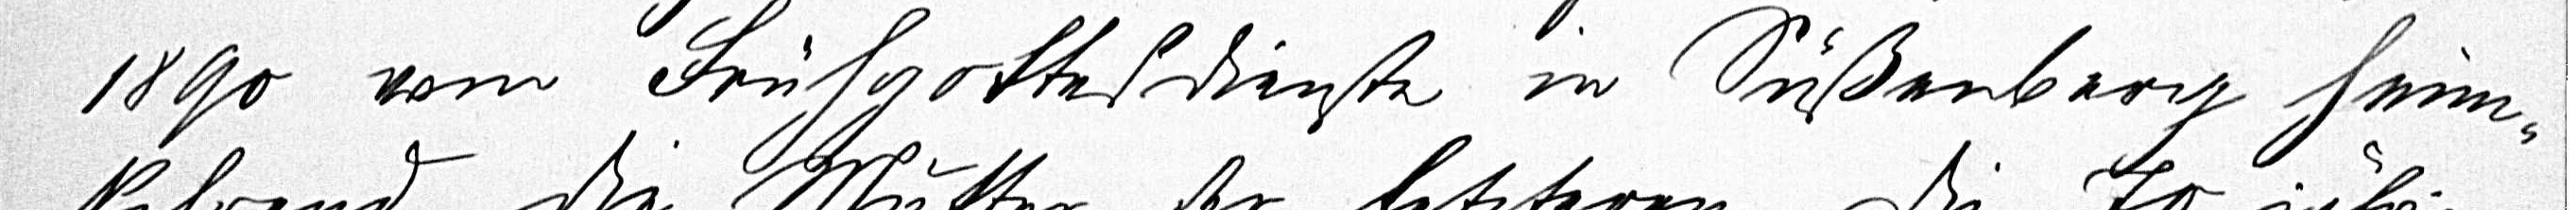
1890 vom Frühgottesdienste in Süßenberg heim¬
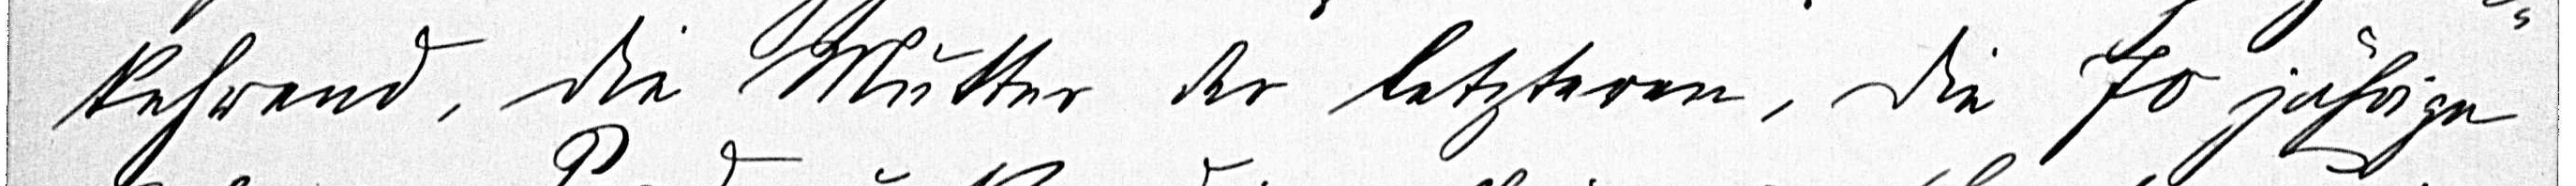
kehrend, die Mutter der letzteren, die 70 jährige
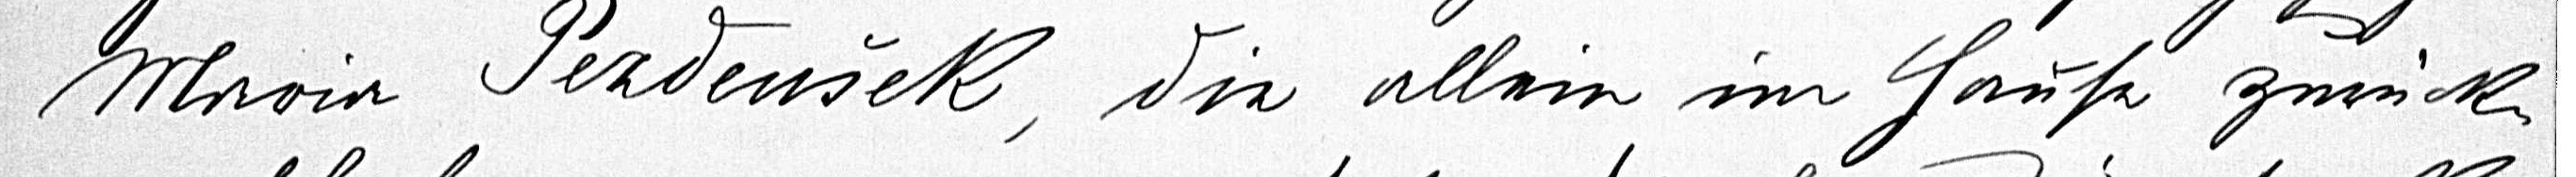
Maria Pezdeušek, die allein im Hause zurück
